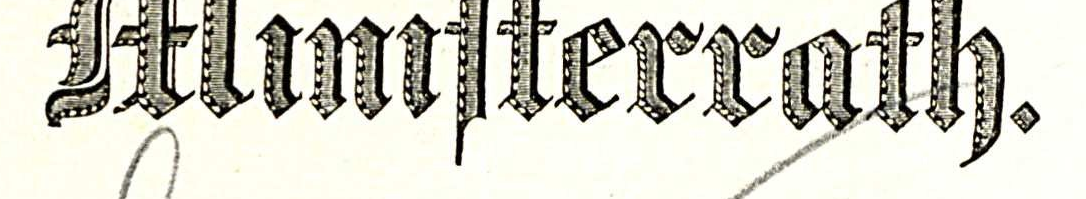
Ministerrath
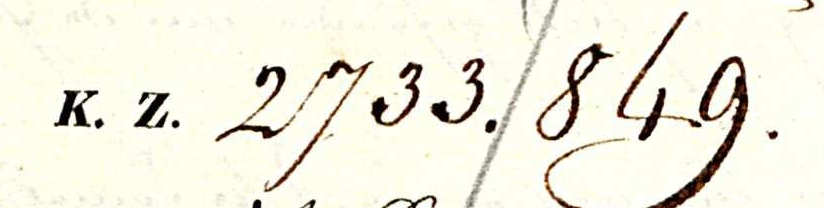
KZ 2733 849
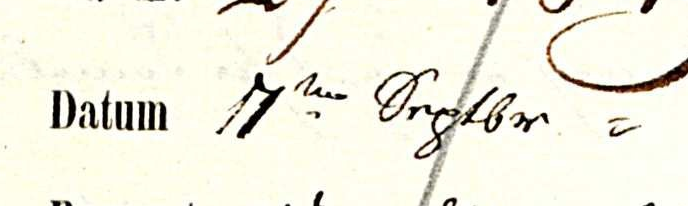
Datum 11ten Septbr “
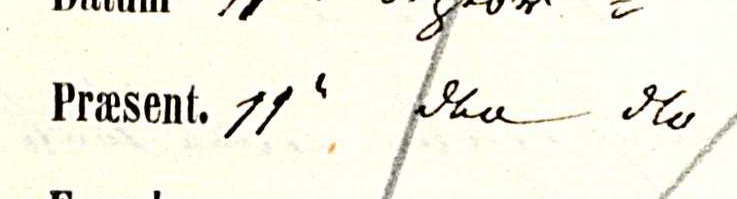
Praesent 11 dto dto
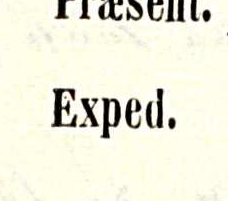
Exped.
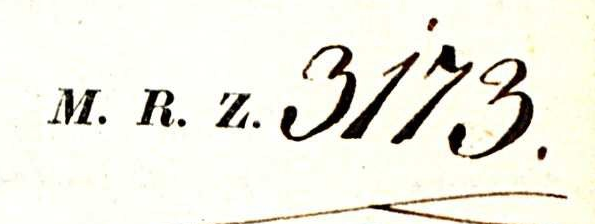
MRZ 3173
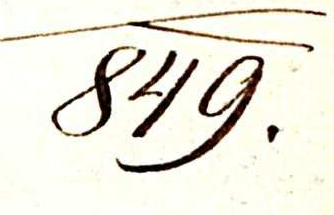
849
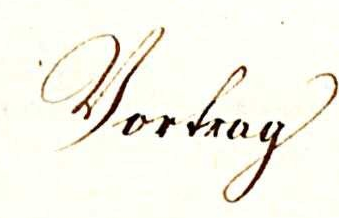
Vortrag
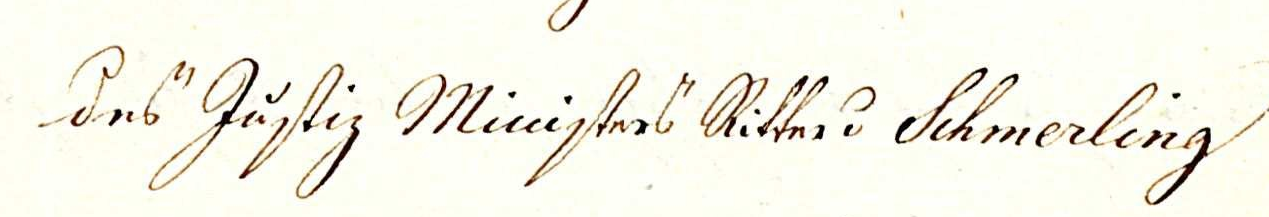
des Justiz Ministers Ritter v. Schmerling
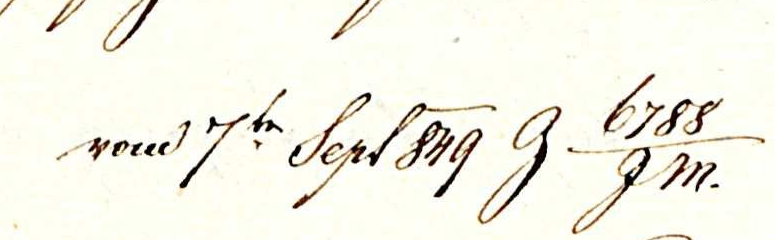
vom 7ten Sept 849 Z 6788/
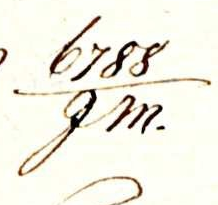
JM.
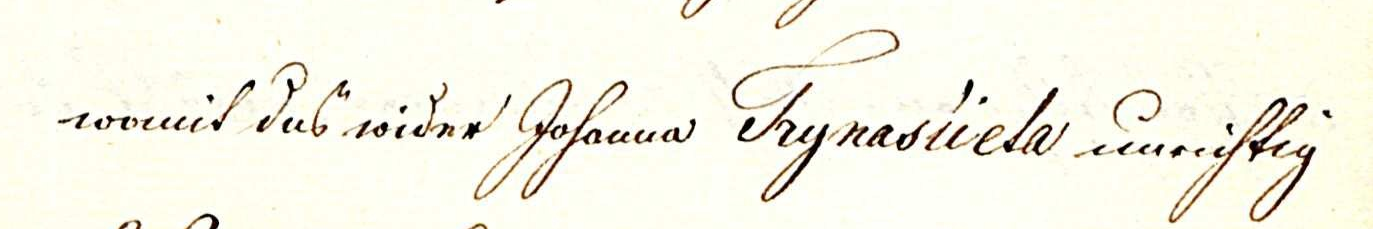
womit das wider Johanna Trynaścieta unrichtig
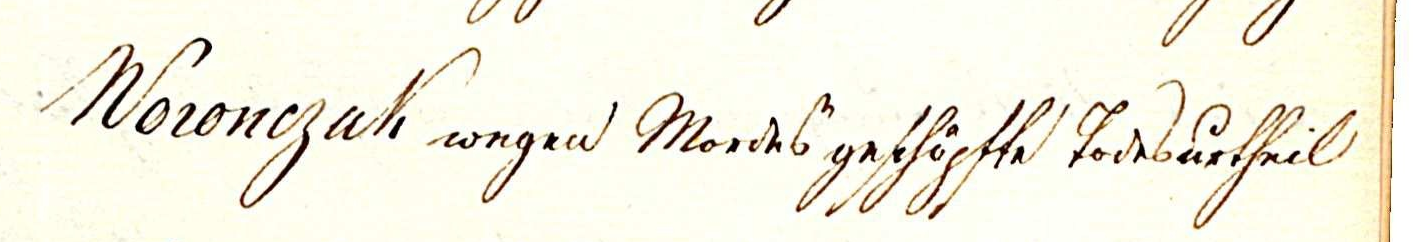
Woronczak wegen Mordes geschöpfte Todesurtheil
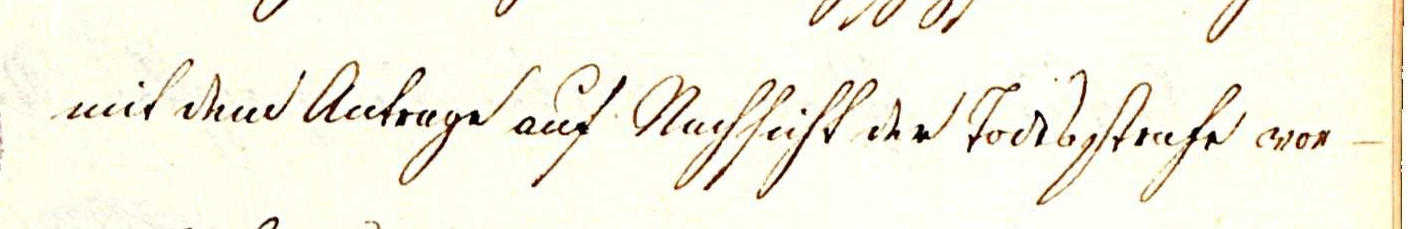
mit dem Antrage auf Nachsicht der Todesstrafe vor¬
